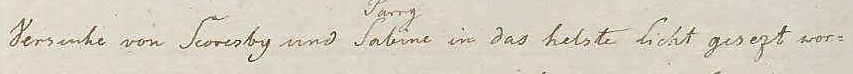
Versuche von Scoresby und Sabine Parryin das helste Licht gesezt wor-
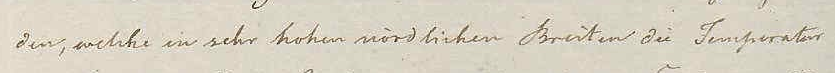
den, welche in sehr hohen nördlichen Breiten die Temperatur
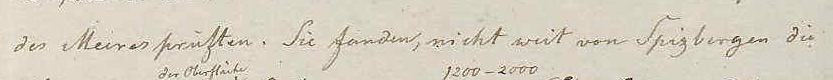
des Meeres prüften. Sie fanden, nicht weit von Spizbergen die
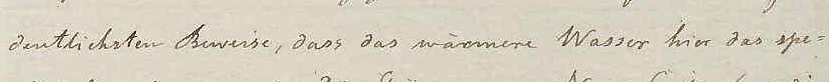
deutlichsten Beweise, dass das wärmere Wasser hier das spe-
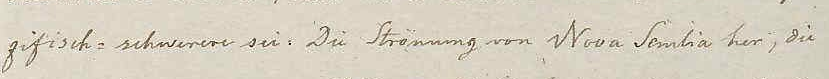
zifisch-schwerere sei. Die Strömung von Nova Semlia her, die
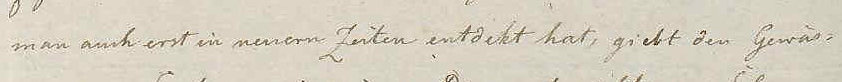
man auch erst in neuern Zeiten entdekt hat, giebt den Gewäs-
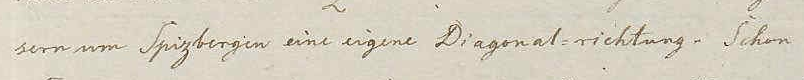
sern um Spizbergen eine eigene Diagonal-richtung. Schon
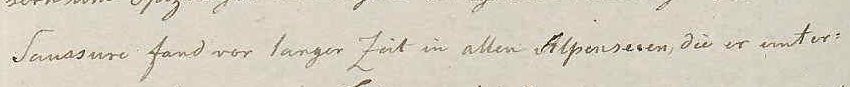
Saussure fand vor langer Zeit in allen Alpenseeen, die er unter-
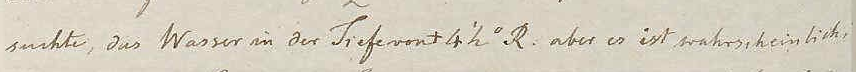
suchte, das Wasser in der Tiefe von +4½° R. aber es ist wahrscheinlich,
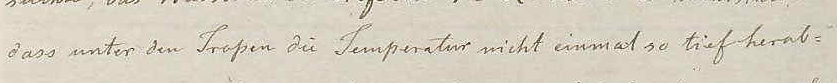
dass unter den Tropen die Temperatur nicht einmal so tief herab-
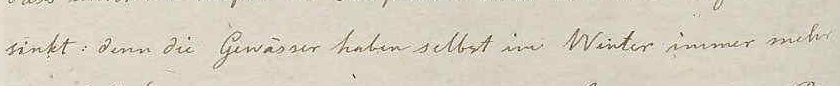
sinkt: denn die Gewässer haben selbst im Winter immer mehr
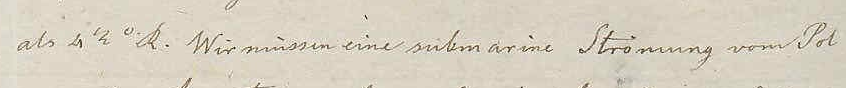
als 4½° R. Wir müssen eine submarine Strömung vom Pol
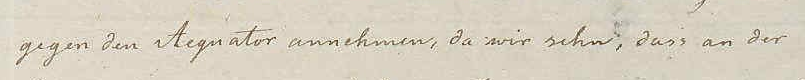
gegen den Aequator annehmen, da wir sehn, dass an der
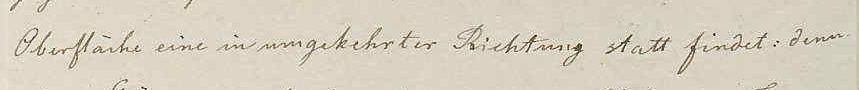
Oberfläche eine in umgekehrter Richtung statt findet: denn
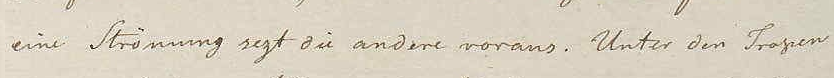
eine Strömung sezt die andere voraus. Unter den Tropen
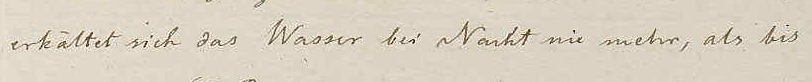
erkältet sich das Wasser bei Nacht nie mehr, als bis
